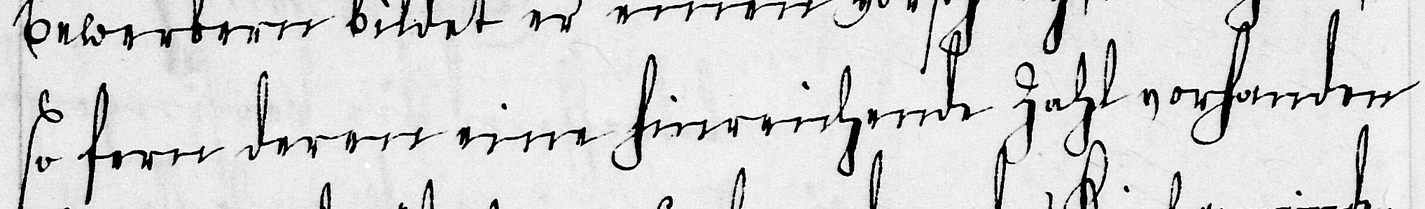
so fern deren eine hinreichende Zahl vorhanden
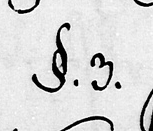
§. 3.
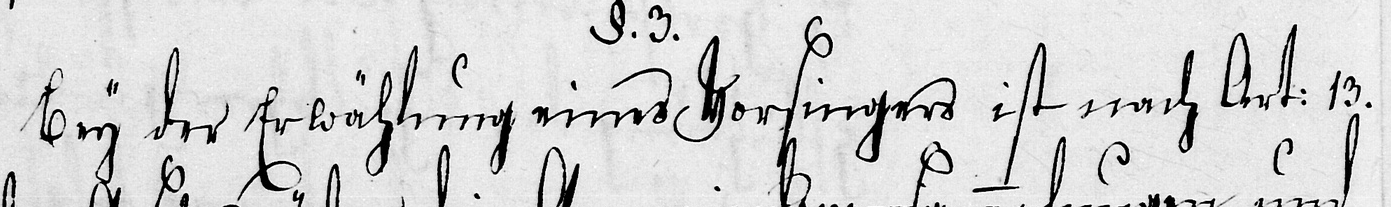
Bey der Erwählung eines Vorsingers ist nach Art: 13.
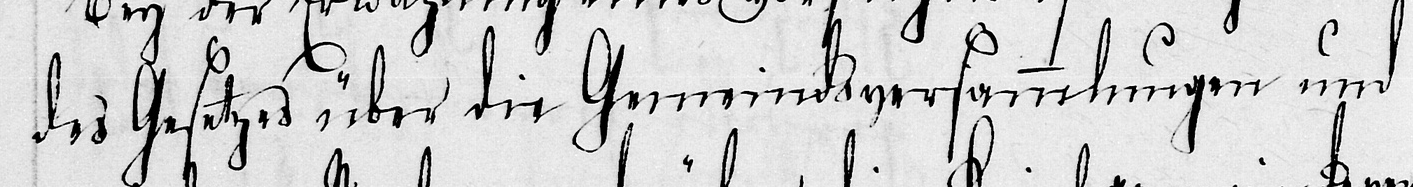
des Gesetzes über die Gemeindsversammlungen und
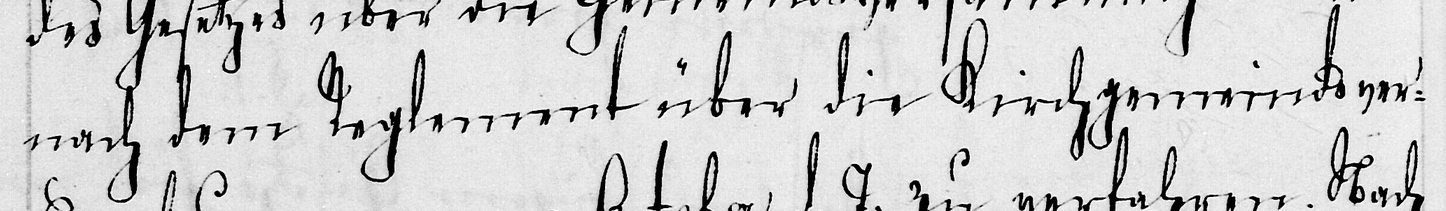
nach dem Reglement über die Kirchgemeindsver¬
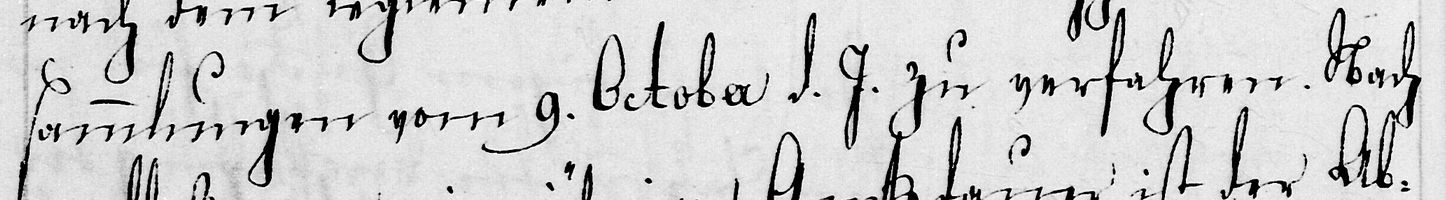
sammlungen vom 9. October d. J. zu verfahren. Nach
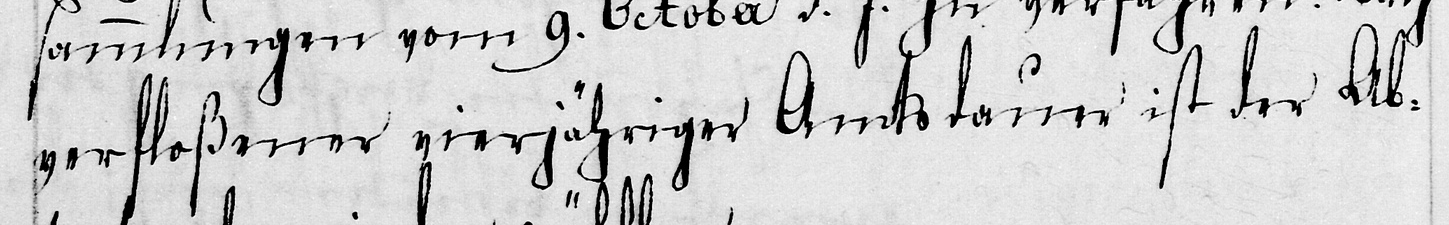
verfloßener vierjähriger Amtsdauer ist der Ab¬
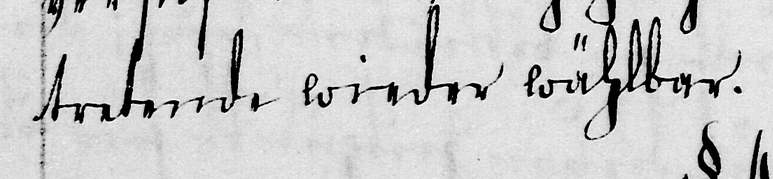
tretende wieder wählbar.
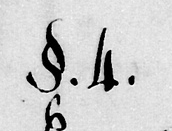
§. 4.
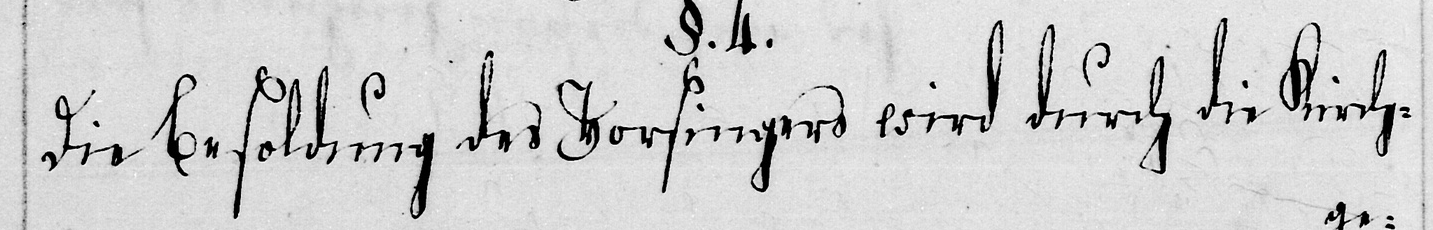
Die Besoldung des Vorsingers wird durch die Kirch-
